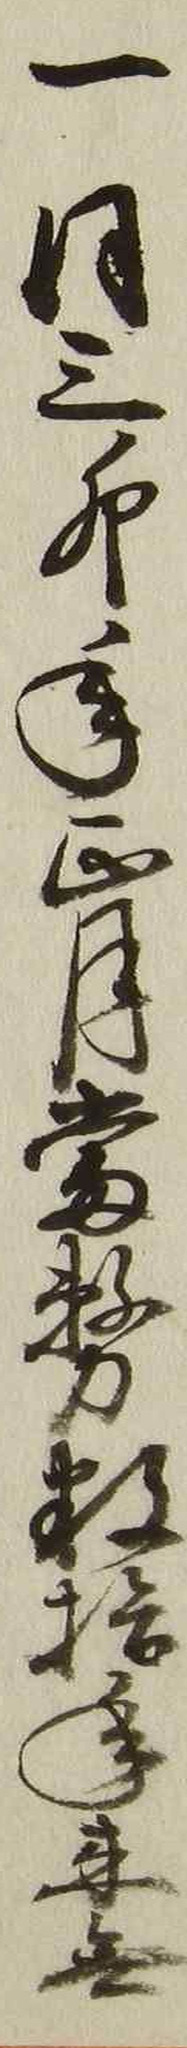一同三卯年正月当務数拾年来無
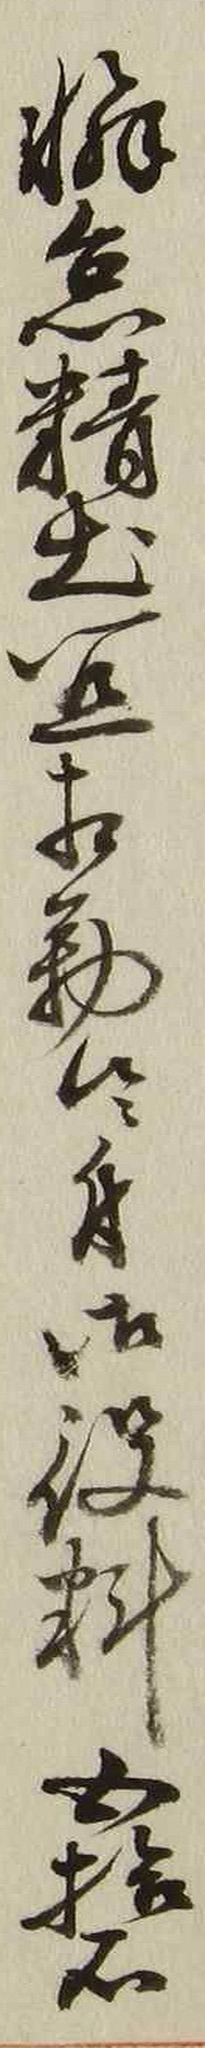懈怠精出宜相勤候ニ付御役料五拾石
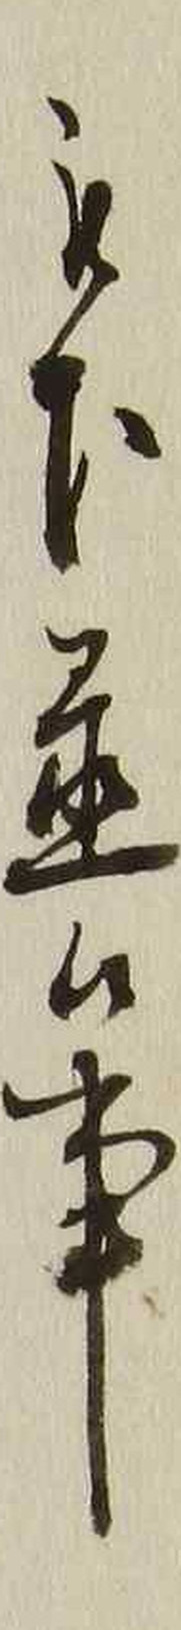被下置候事
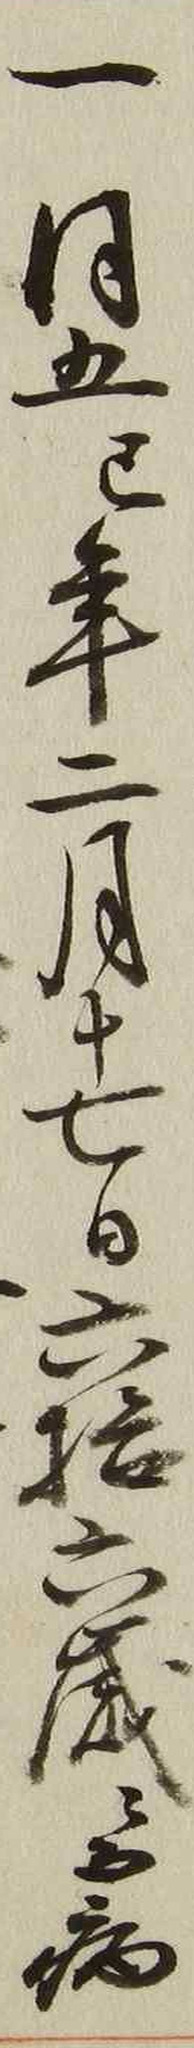一同五巳年二月十七日六拾六歳ニ而病
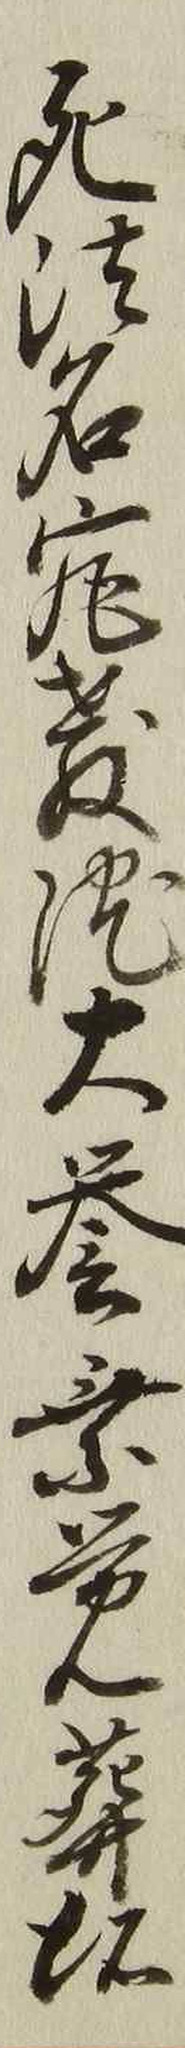死法名宨教院大誉乗覚葬所
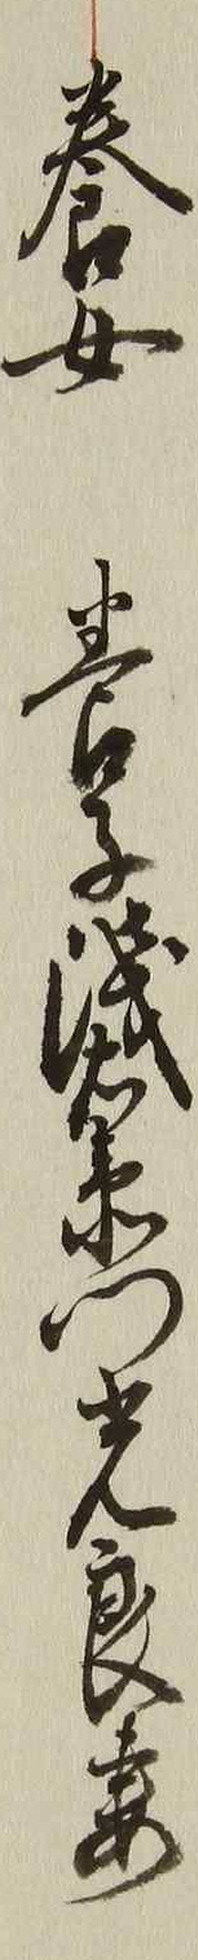養女養子浅右衛門光良妻
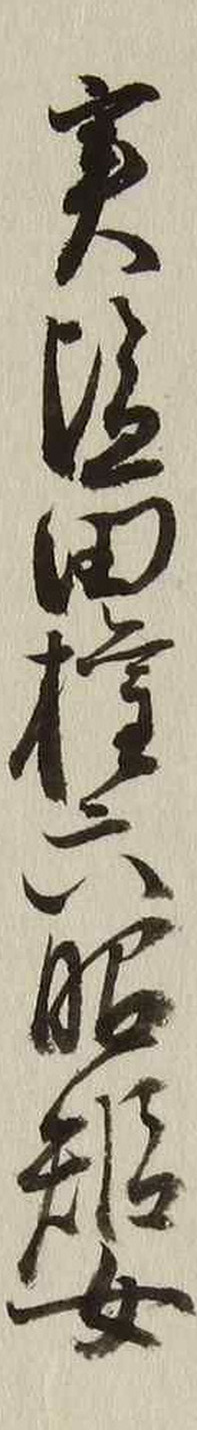実塩田権六昭矩女
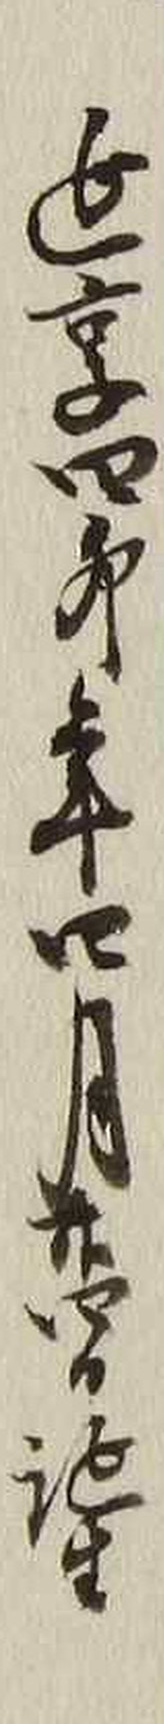延享四卯年四月廿四日誕生
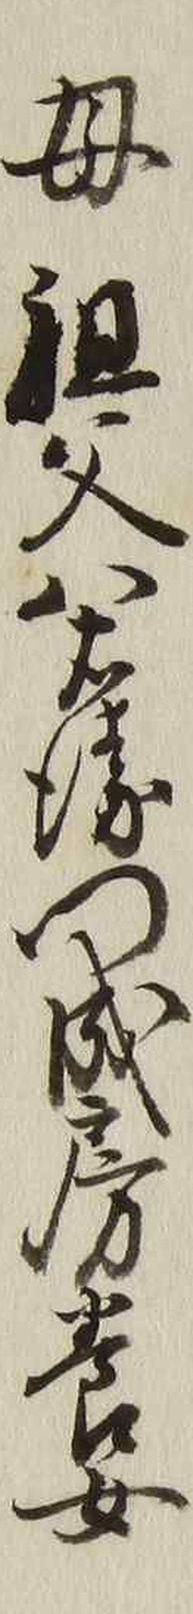母祖父八右衛門成房養女
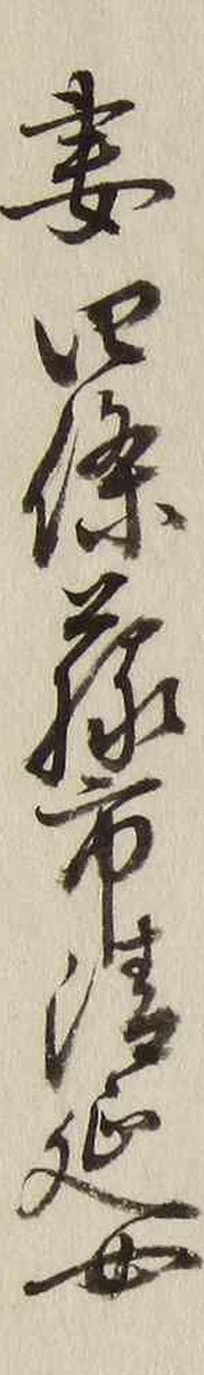妻四条藤市清延女
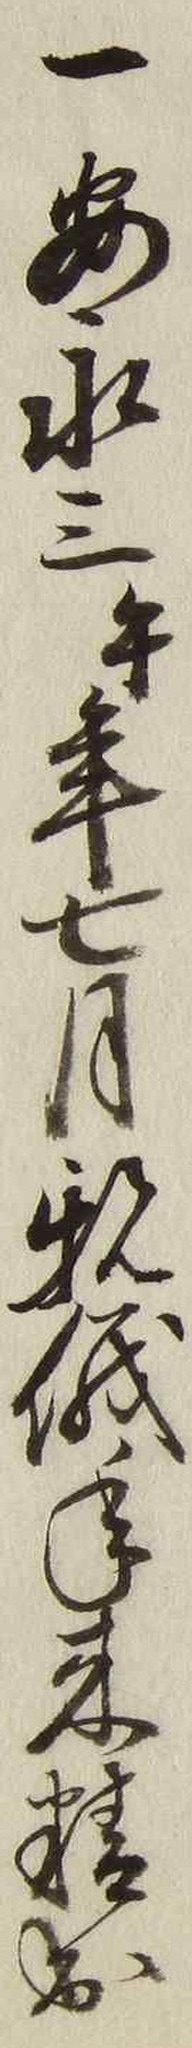一安永三午年七月親儀年来精出

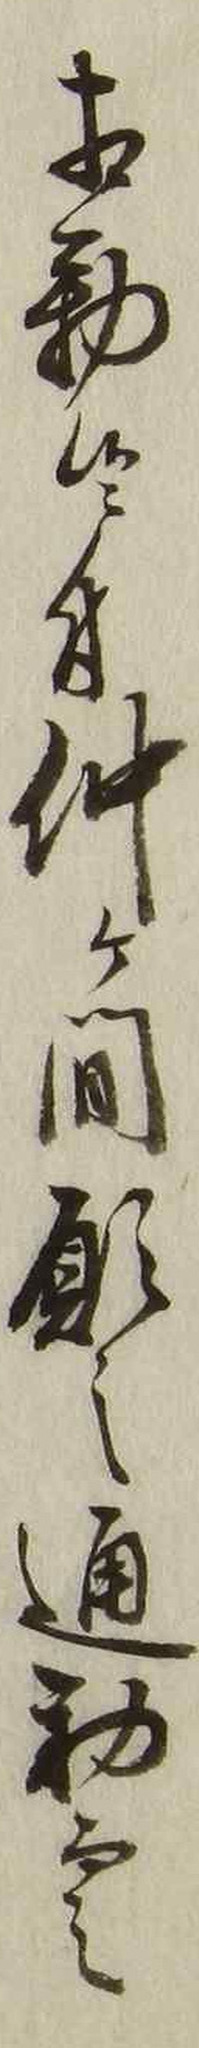相勤候ニ付仲ケ間願之通初而之
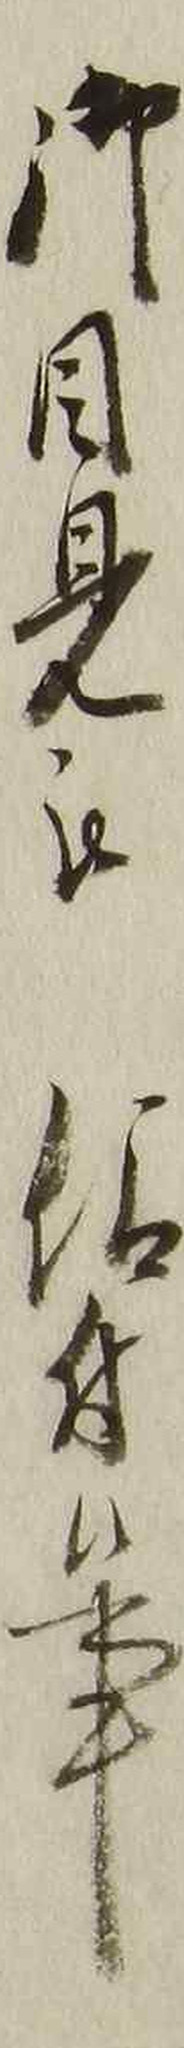御目見被仰付候事
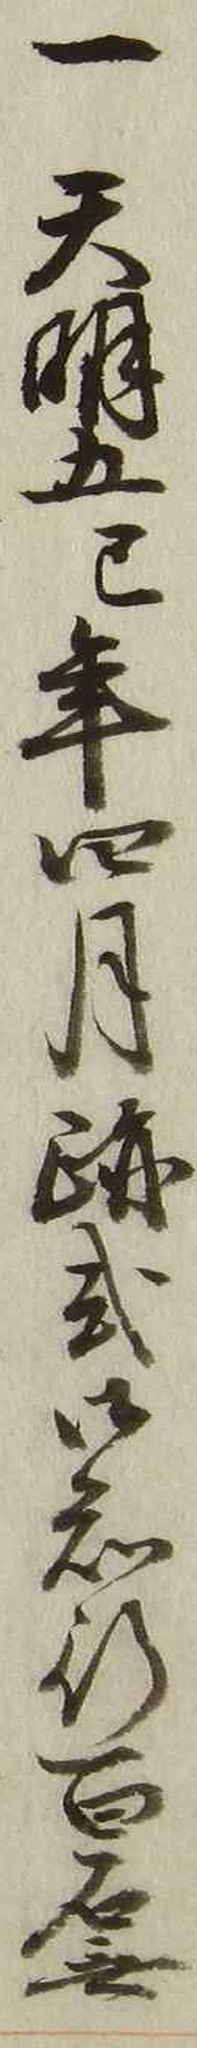一天明五巳年四月跡式御知行百石無
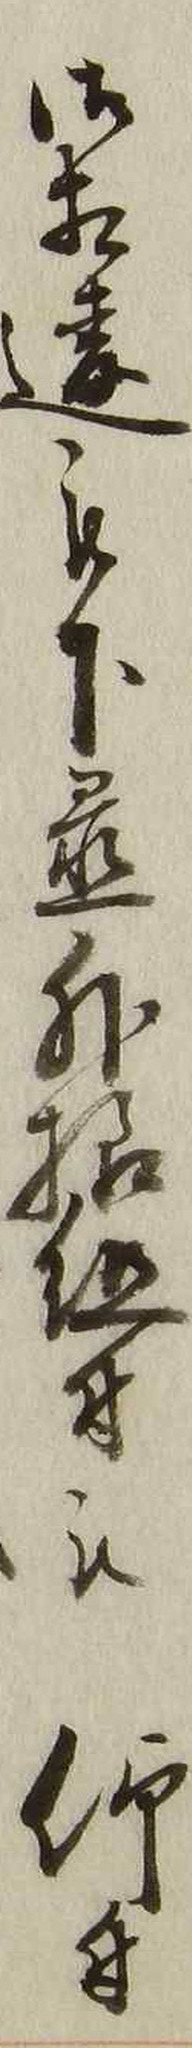御相違被下置外様組付被仰付
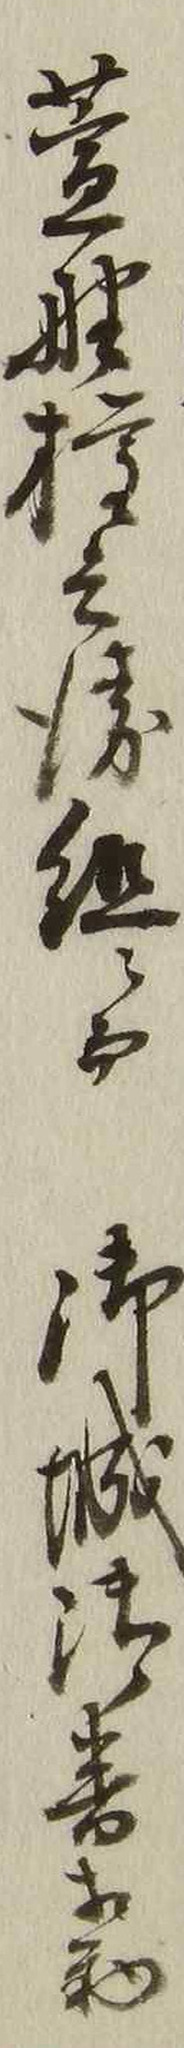萱野権兵衛組ニ而御城御番相勤
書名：諸士系譜　巻之27　い之部27
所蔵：会津若松市立会津図書館
